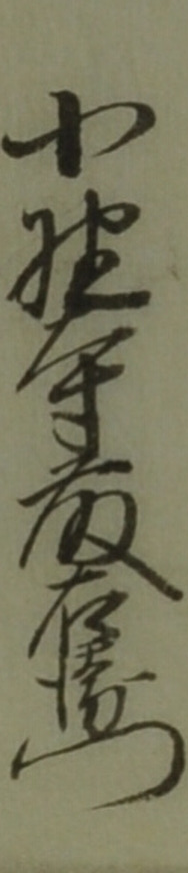小野寺藤右衛門
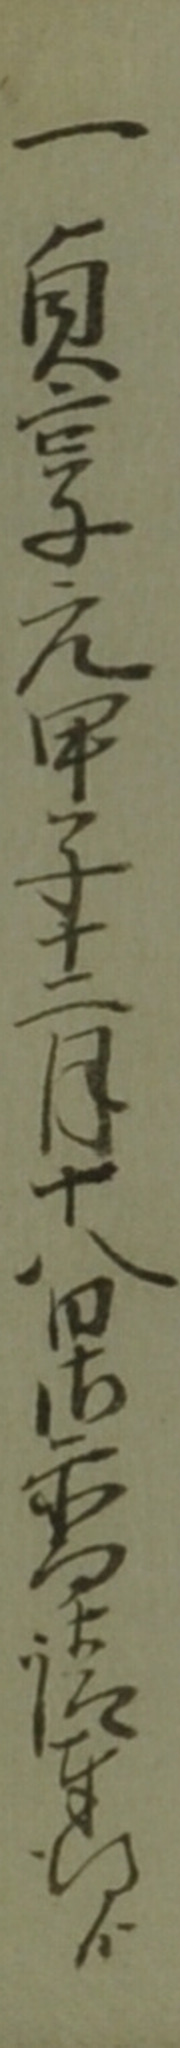一貞享元甲子十二月十八日御普請奉行より
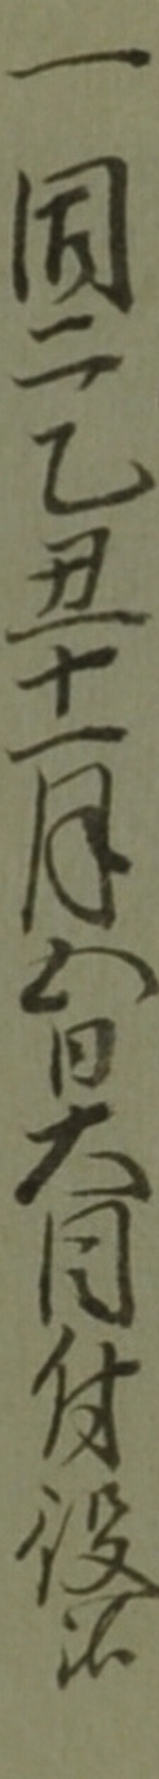一同二乙丑十一月五日大目付役被
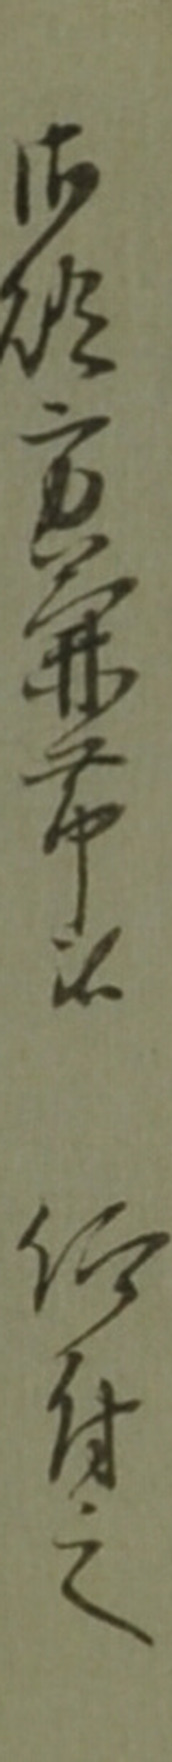御賄方兼帯被仰付之
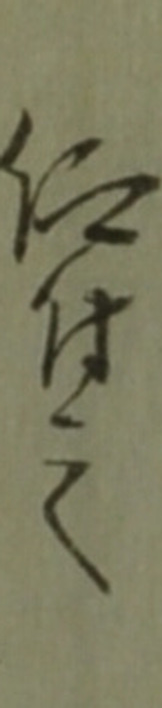仰付之
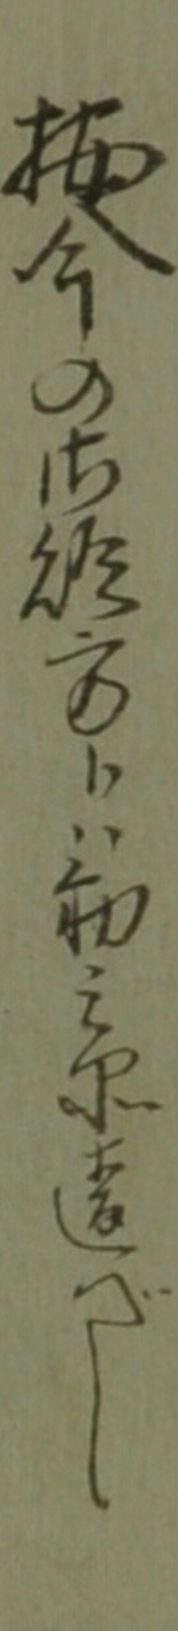按今の御賄方トハ勤めの品違べし
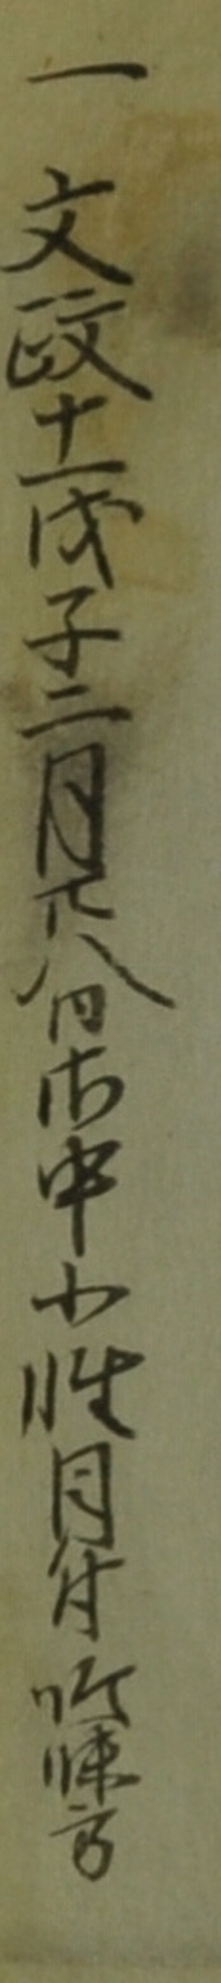一文政十一戊子二月廿八日御中小姓目付吟味方
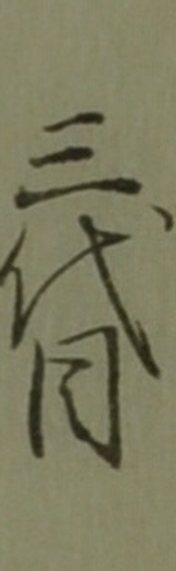三代目
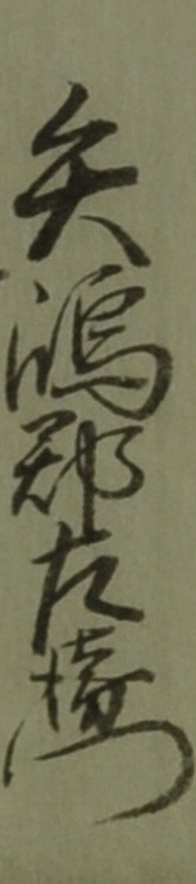矢嶋郡左衛門
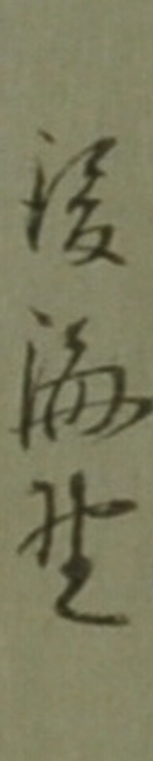後海野
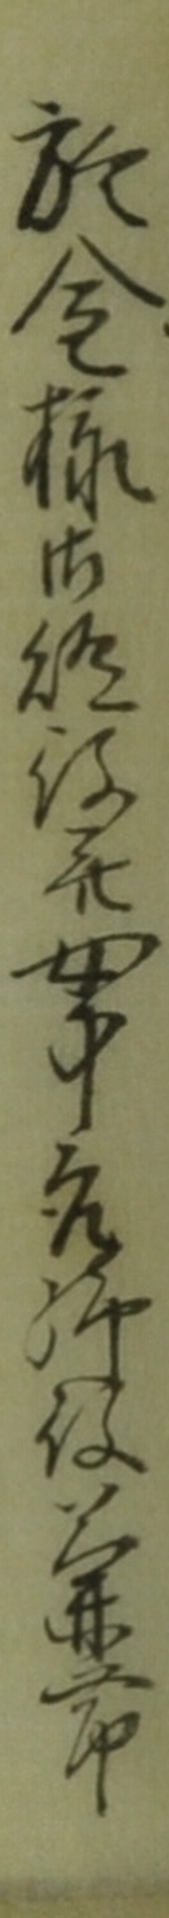於金様御賄役并女中取締役兼帯

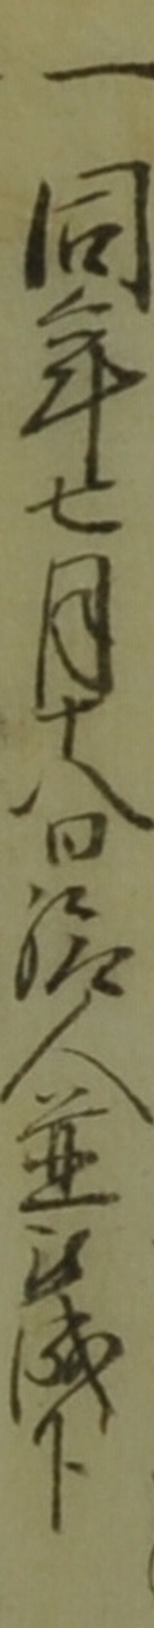一同年七月十八日給人並被成下
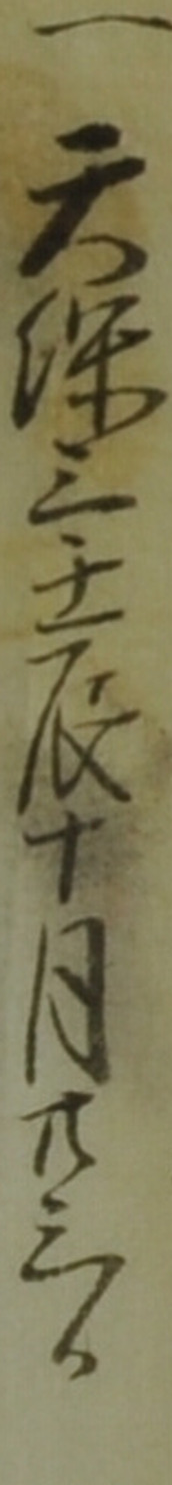一天保三壬辰十月廿三日
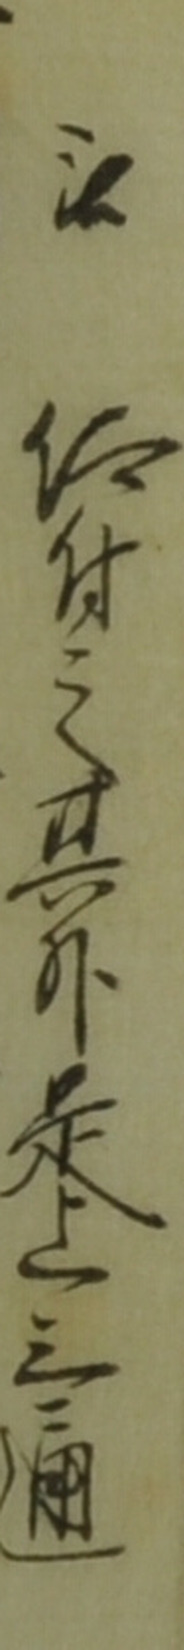被仰付之其外是迄之通
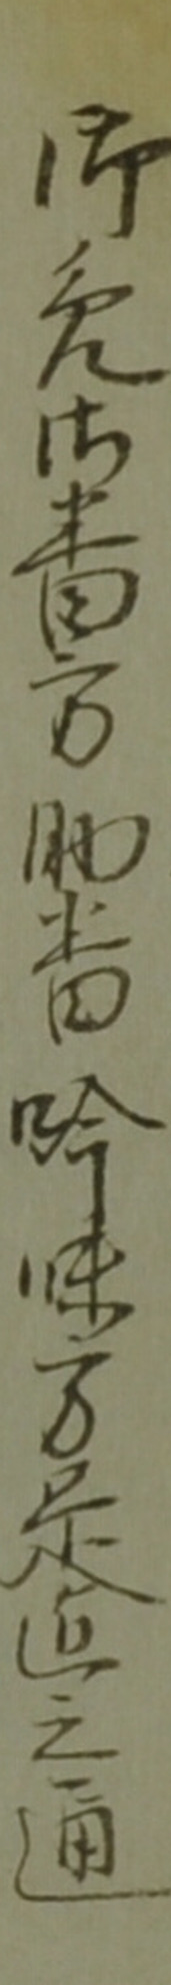御免御番方助番吟味方是迄之通
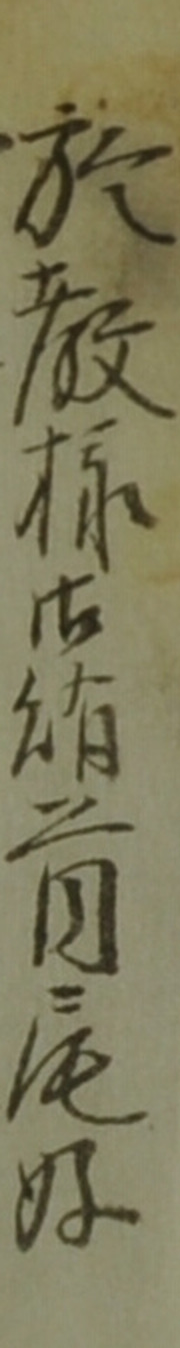於教様御賄首尾好
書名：諸御役代々録（八）
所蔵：伊那市立高遠町図書館・合同会社AMANE
